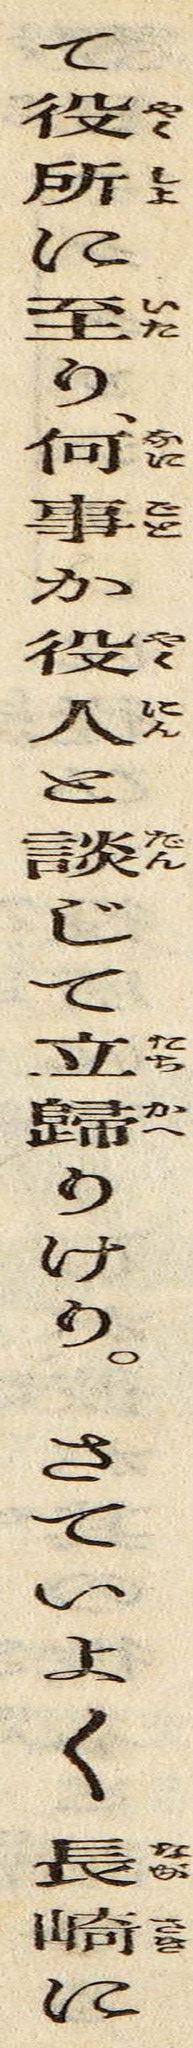て役所に至り、何事か役人と談じて立帰りけり。さていよ〳〵長崎に
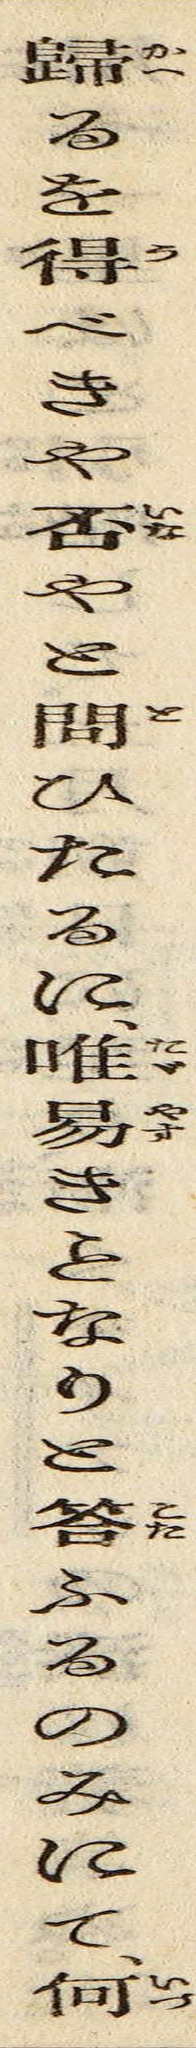帰るを得べきや否やと問ひたるに、唯易きことなりと答ふるのみにて、何
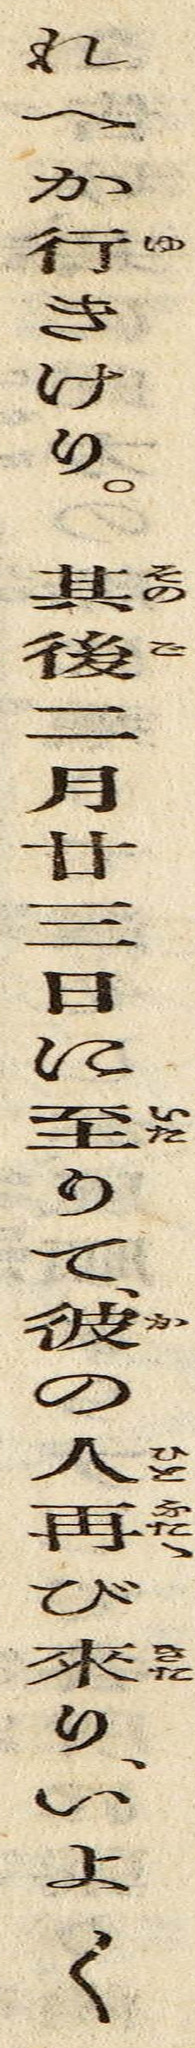れへか行きけり。其後二月廿三日に至りて、彼の人再び来り、いよ〳〵
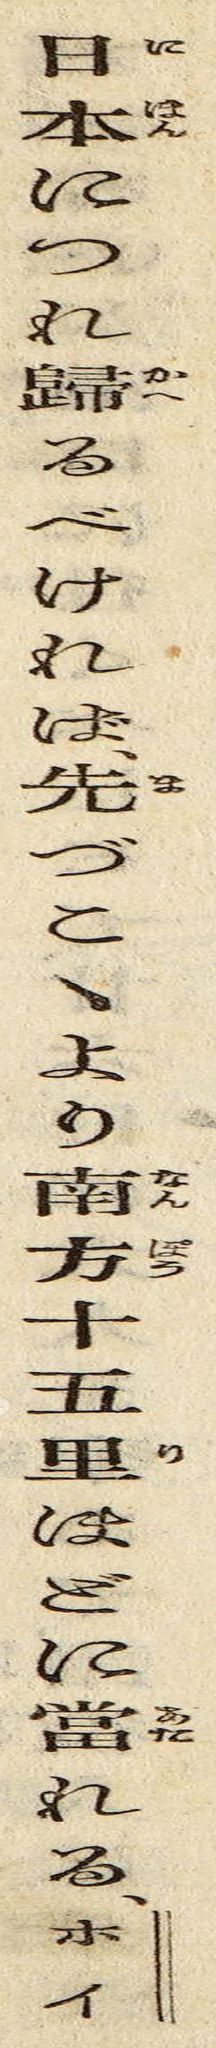日本につれ帰るべければ、先づこヽより南方十五里ほどに当れる、ホイ

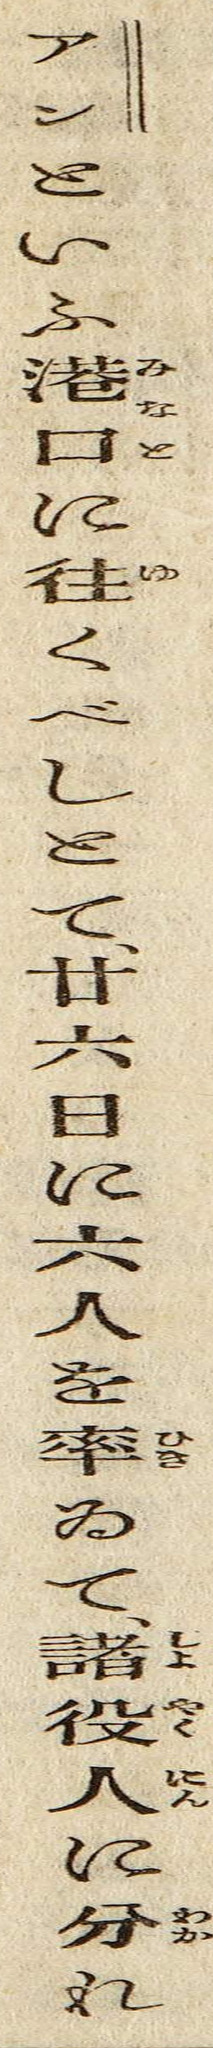アンといふ港口に往くべしとて、廿六日に六人を率ゐて、諸役人に分れ
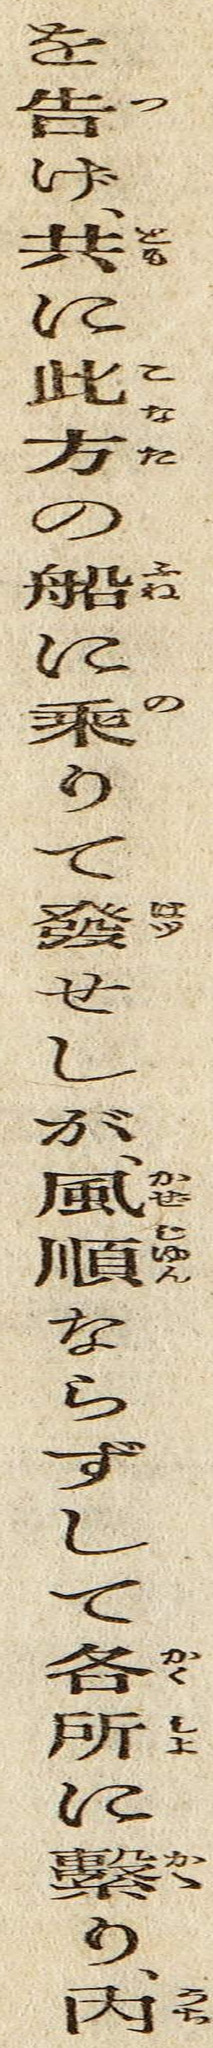を告げ、共に此方の船に乗りて発せしが、風順ならずして各所に繋り、内
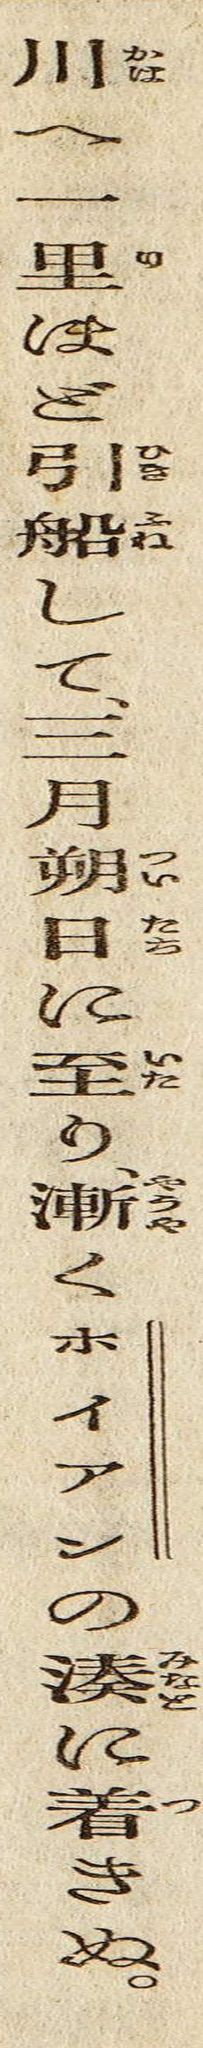川へ一里ほど引船して、三月朔日に至り、漸くホイアンの湊に着きぬ。
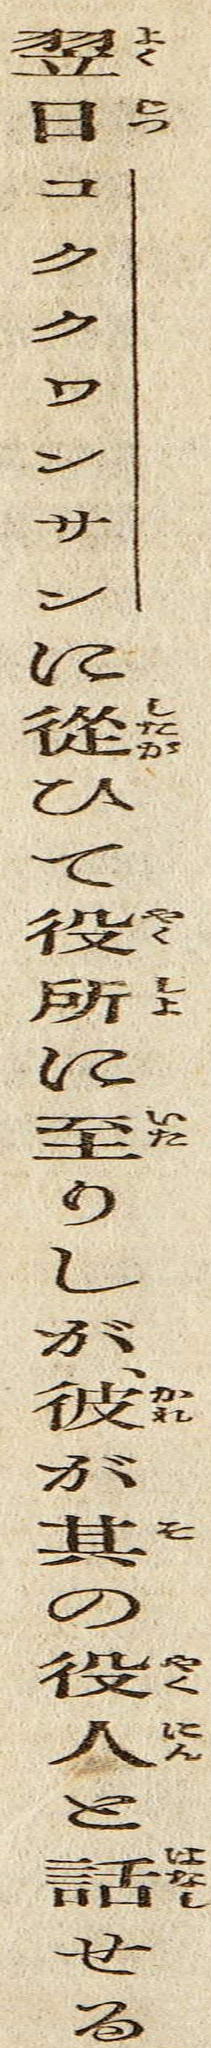翌日コククワンサンに従ひて役所に至りしが、彼が其の役人と話せる
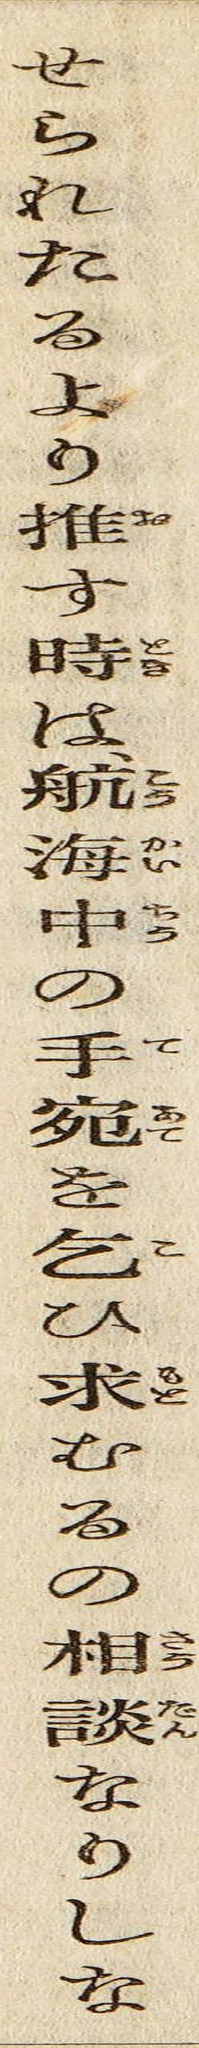せられたるより推す時は、航海中の手宛を乞ひ求むるの相談なりしな
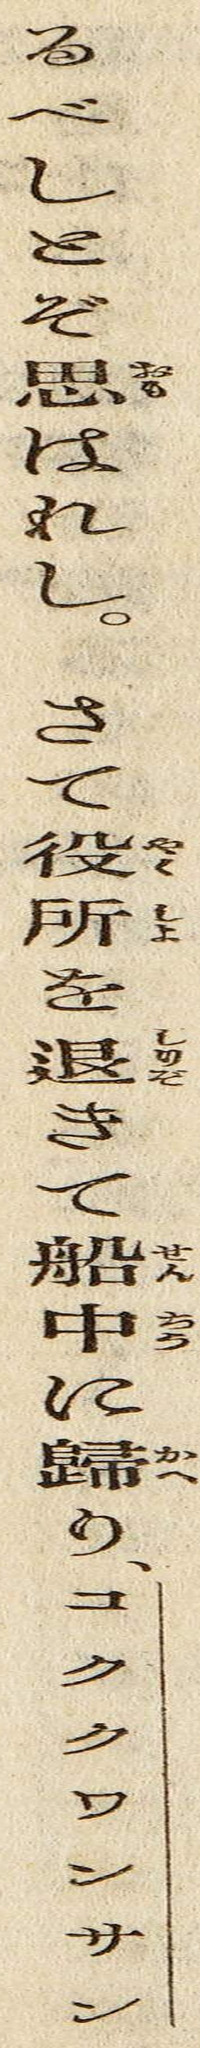るべしとぞ思はれし。さて役所を退きて船中に帰り、コククワンサン
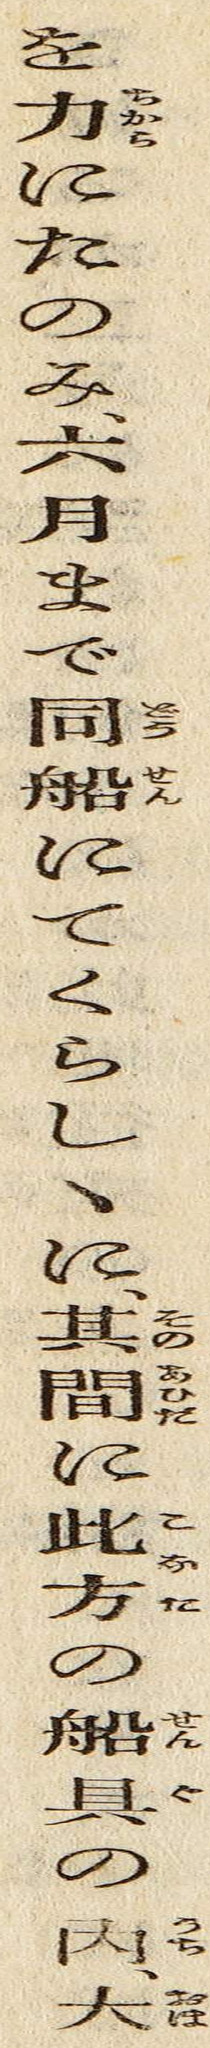を力にたのみ、六月まで同船にてくらしヽに、其間に此方の船具の内、大
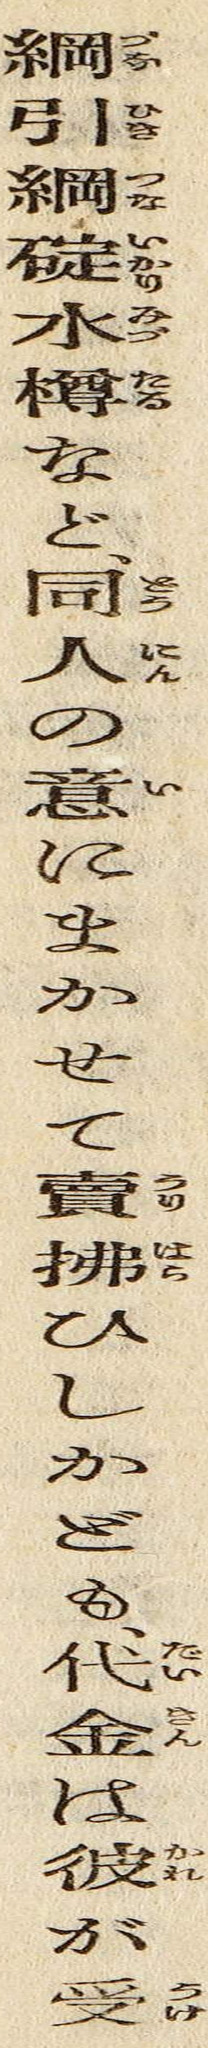綱引綱碇水樽など、同人の意にまかせて売払ひしかども、代金は彼が受
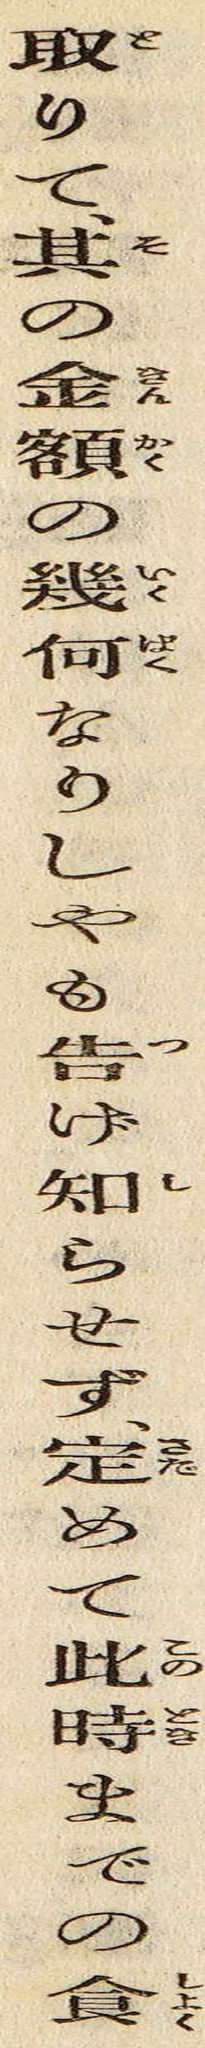取りて、其の金額の幾何なりしやも告げ知らせず、定めて此時までの食
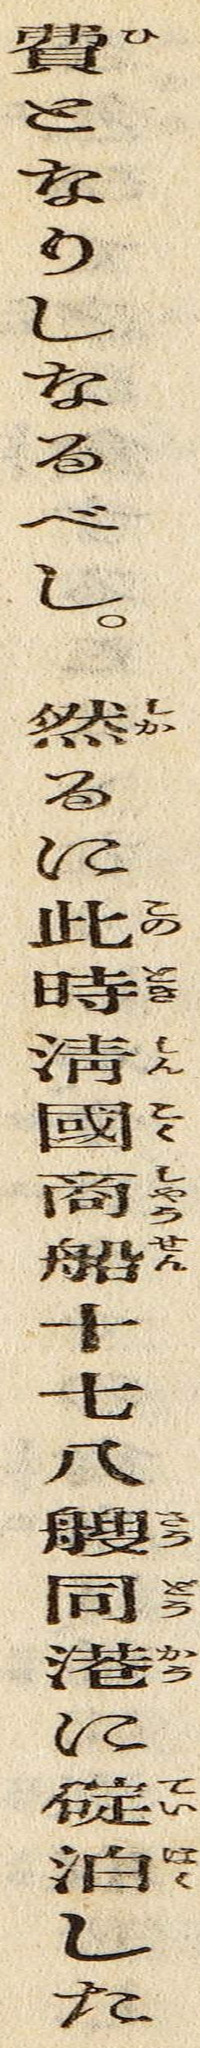費となりしなるべし。然るに此時清国商船十七八艘同港に碇泊した
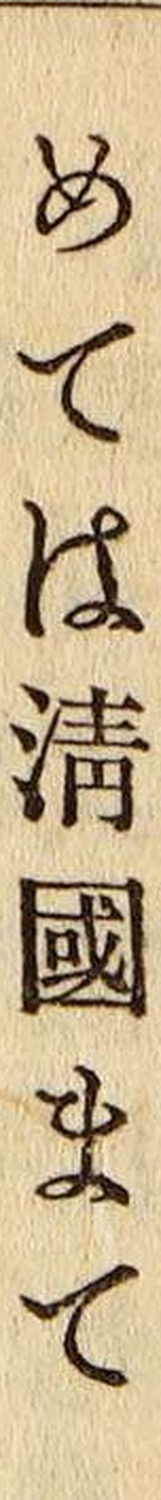めては清国まて
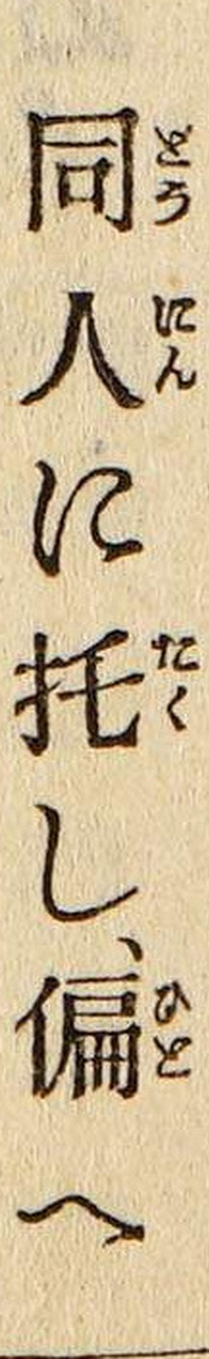同人に托し、偏へ
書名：日本漂流譚
